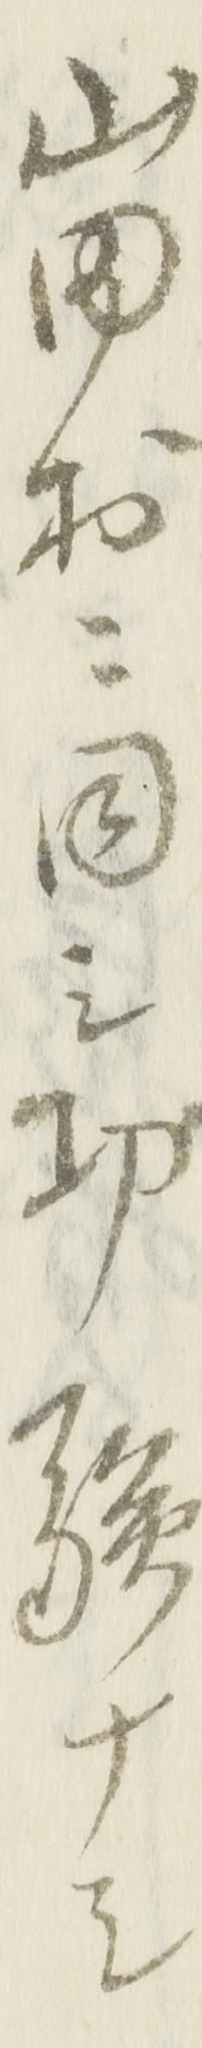山田村ニ同シ功験ナシ
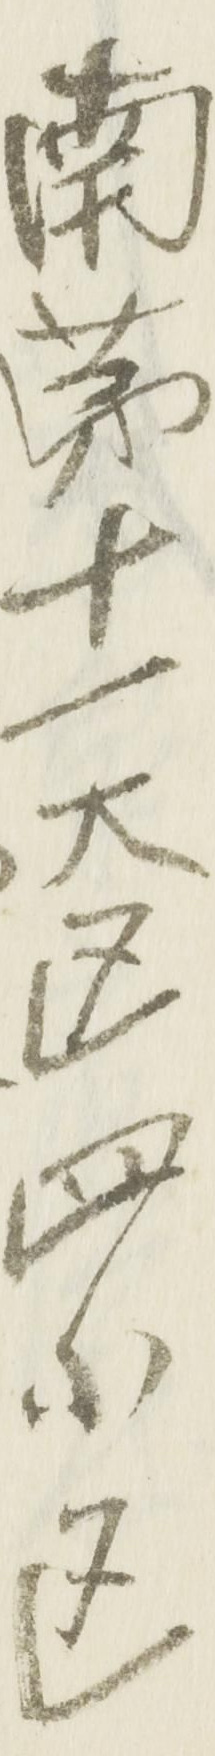南第十一大区四小区
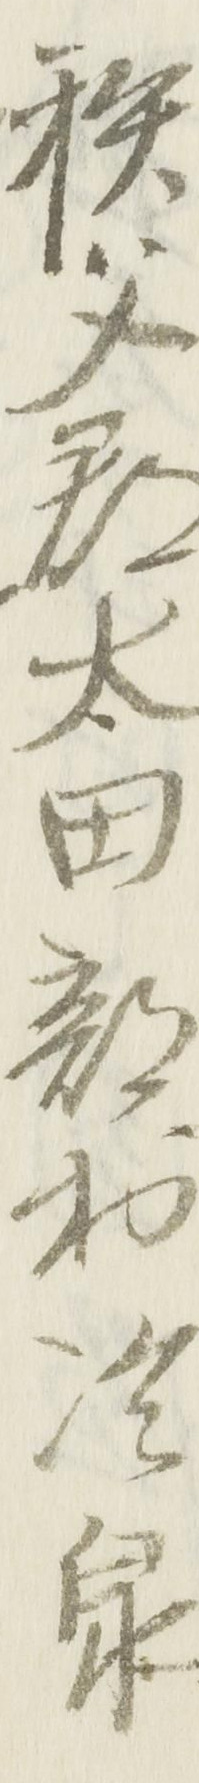秩父郡太田部村冷泉
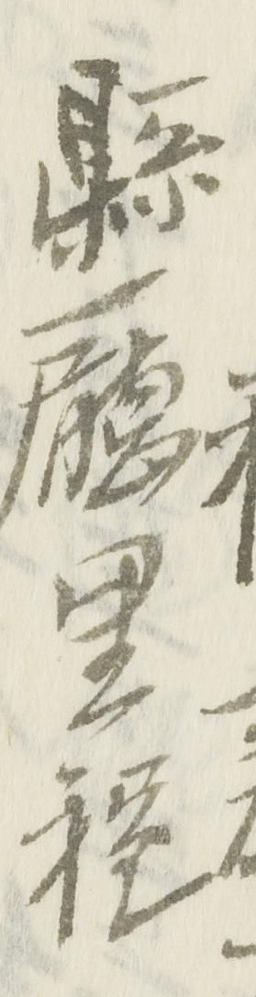県庁里程
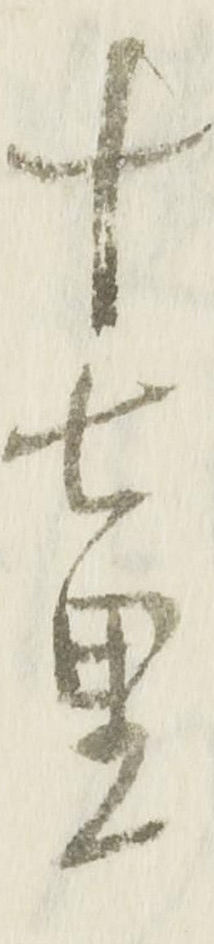十七里
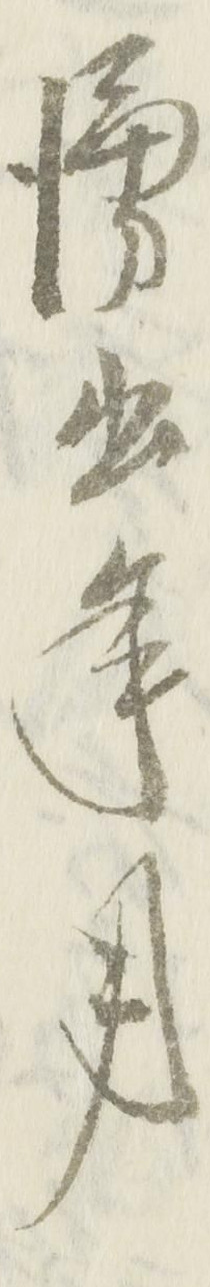湧出年月
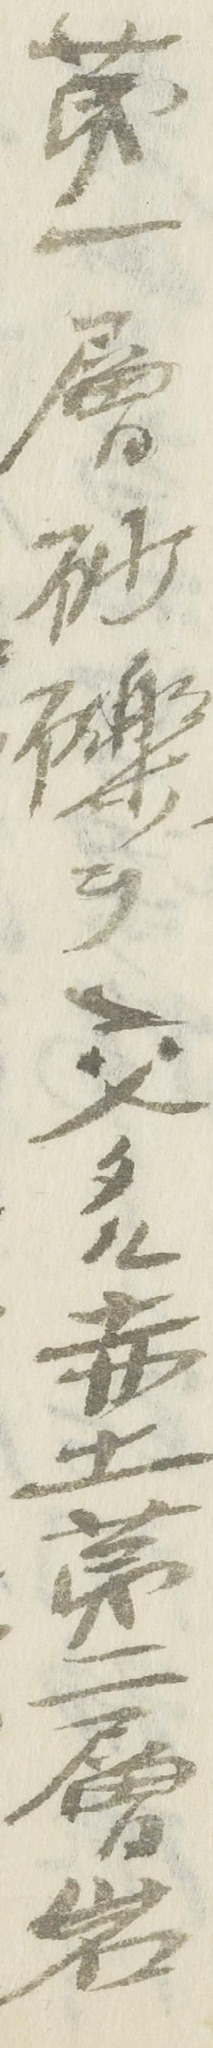第一層砂礫ヲ交タル赤土第二層岩
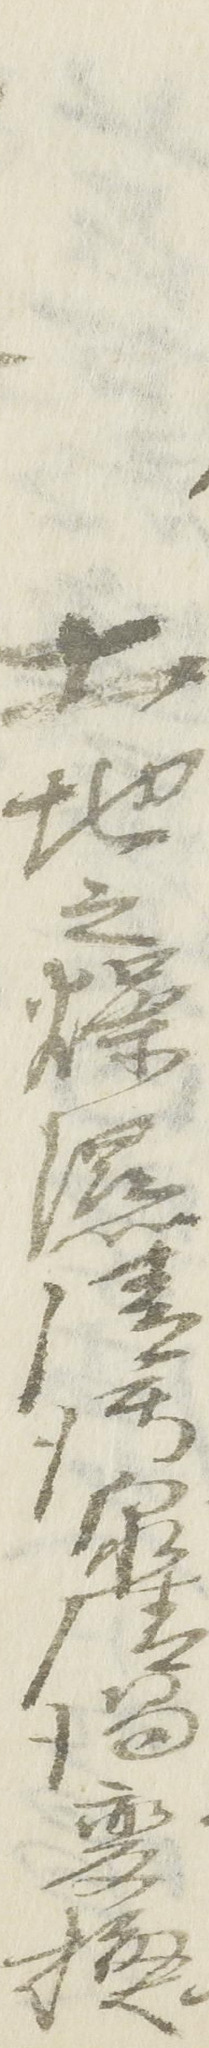土地之燥湿清穢泉清湯変換
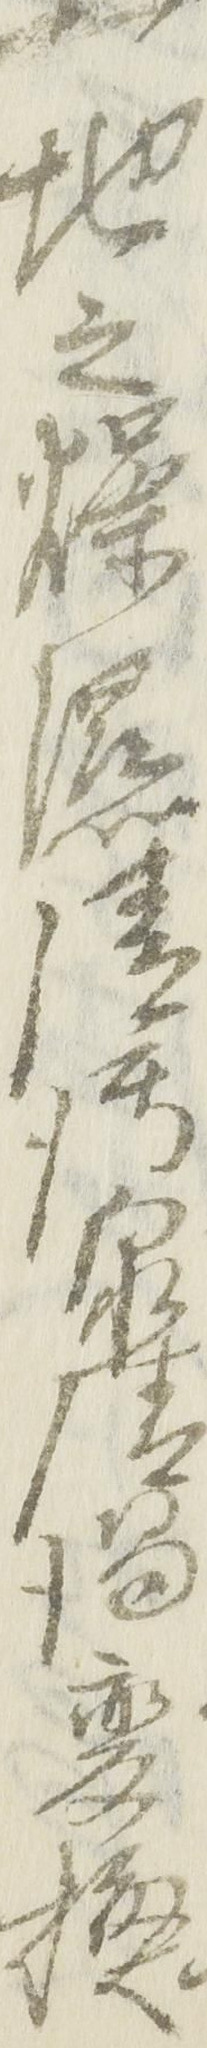土地之燥湿清穢泉清湯変換

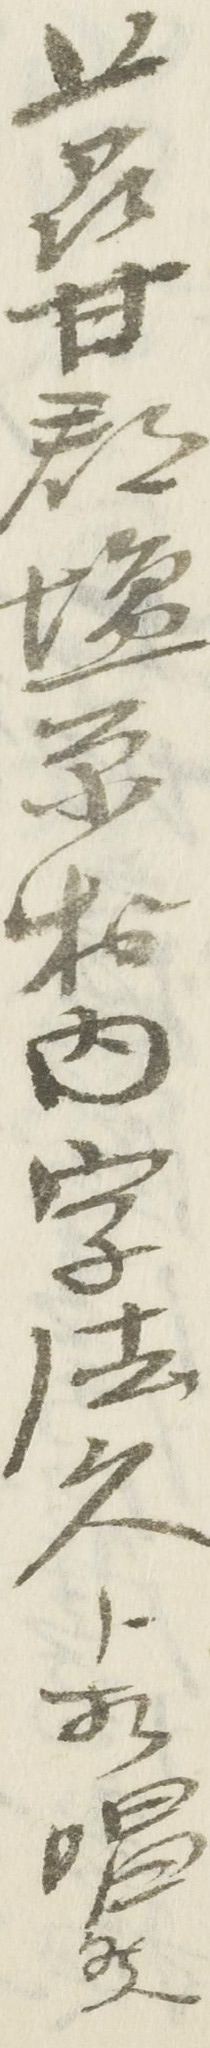上州甘郡塩原村内字法久ト相唱候
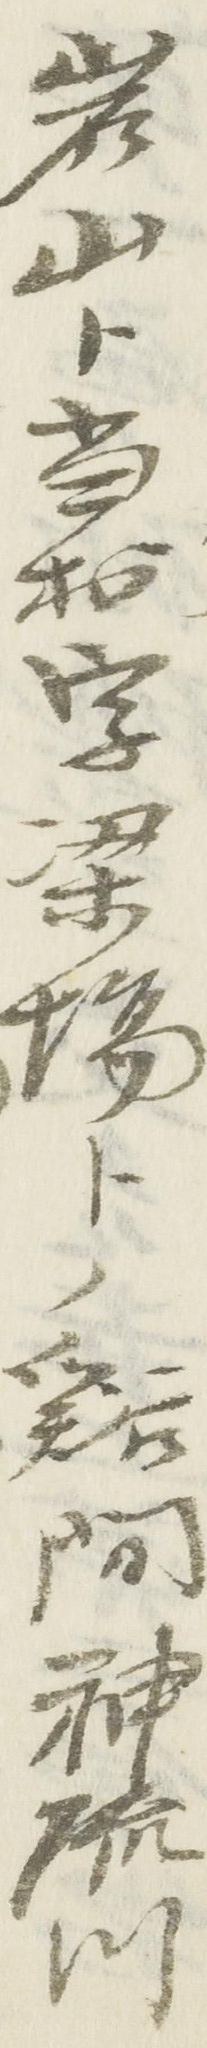岩山ト当村字梁場トノ渓間神流川
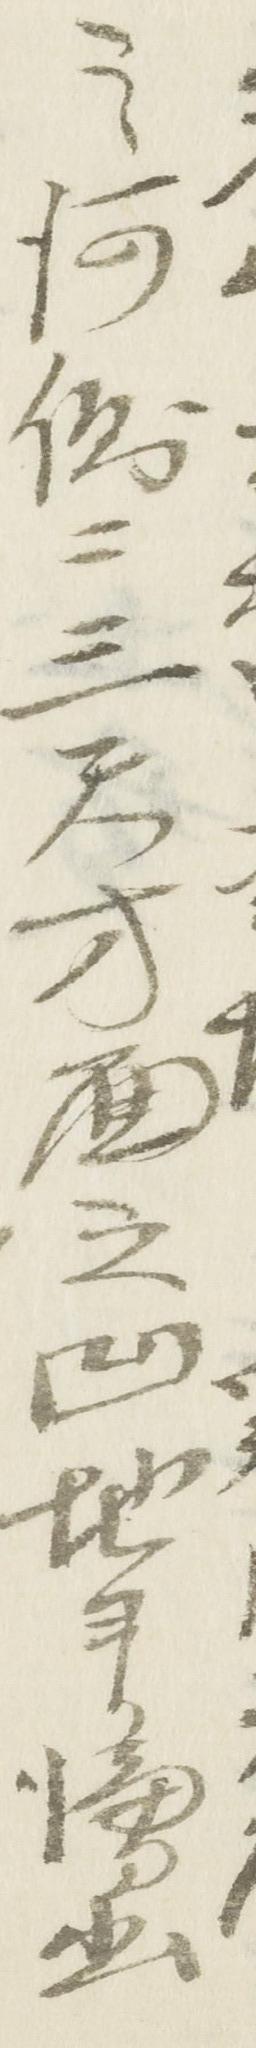之河側ニ三尺方面之凹地ヨリ湧出
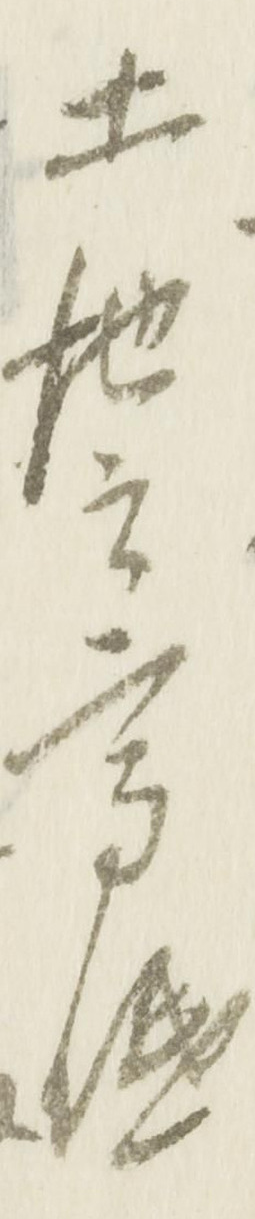土地之高低
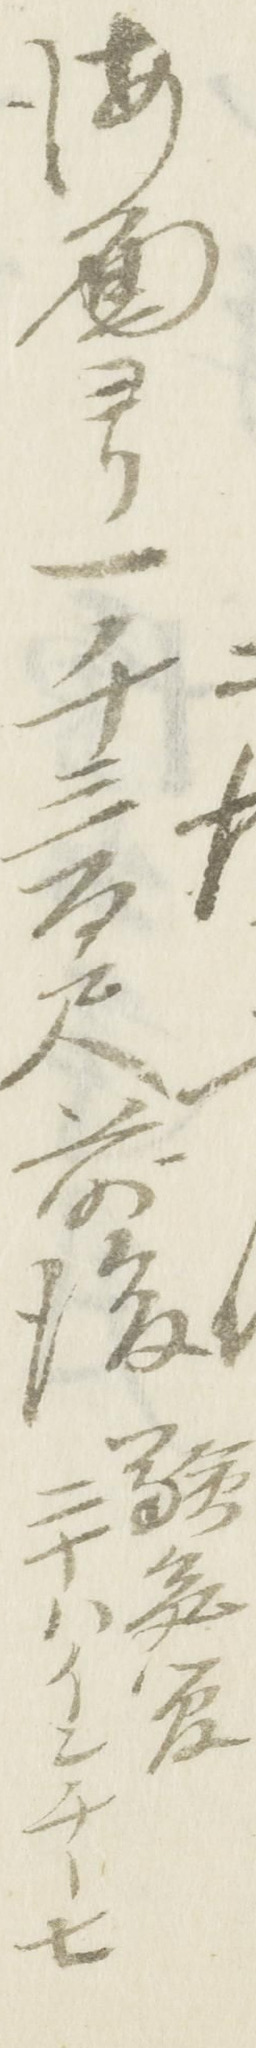海面ヨリ一千三百尺前後験気管二十八インチ―七
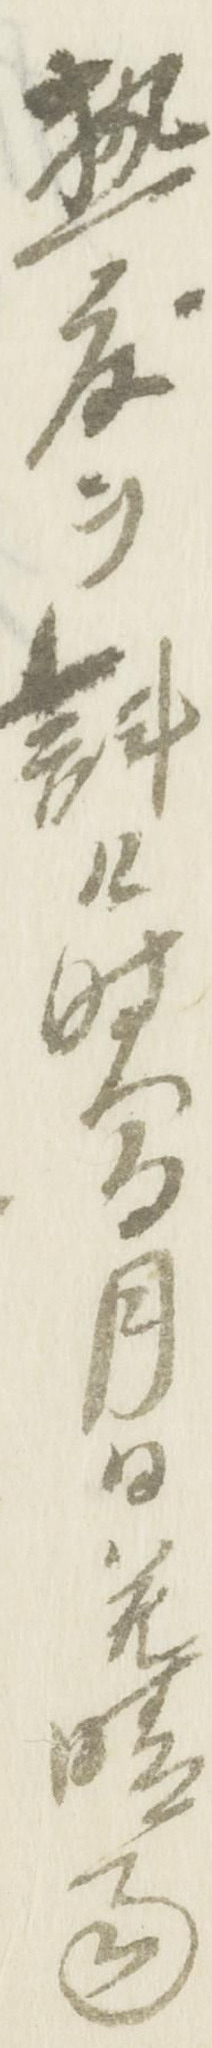熱度ヲ計ル時間月日并晴雨
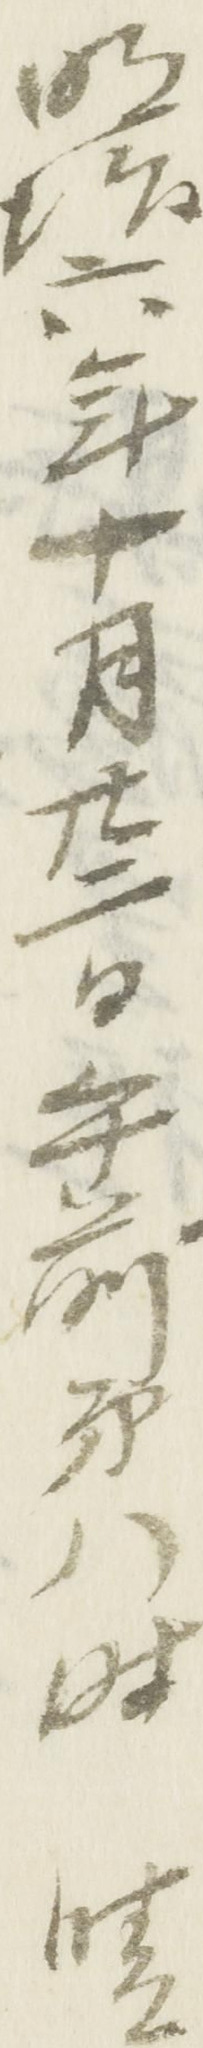明治六年十月廿二日午前第八拾晴
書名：温冷泉試験表
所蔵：東京大学地震研究所図書室 Earthquake Research Institute Library, The University of Tokyo, JAPAN
